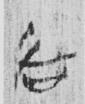左（佐）
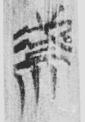○（乎）
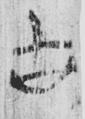古（故）
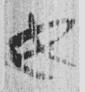女（如）
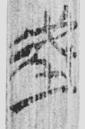○（吾）
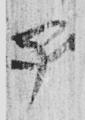子
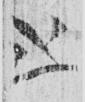之
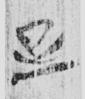足
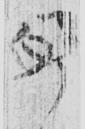肥
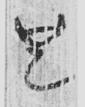也
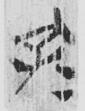孔子
